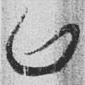㠯（以）
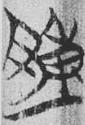○（陳）
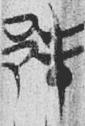邦
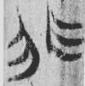非
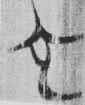它
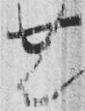也
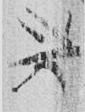先
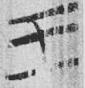王
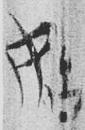姑
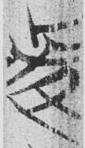姊
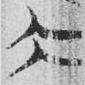大
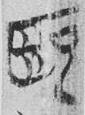巸（姬）
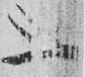之
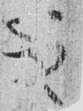邑
